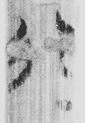行
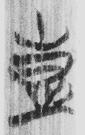彭
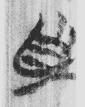且
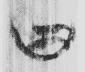曰
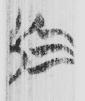於
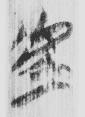𫊟
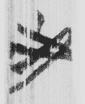我
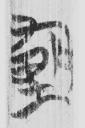{均田}
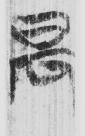晨
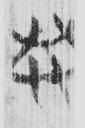共
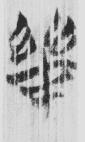𪪋
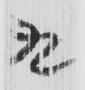九
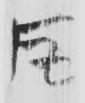厇
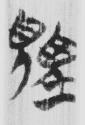{見垔}
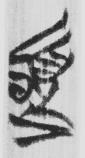{日止頁}
